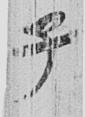子
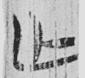亡（無）
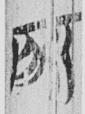所
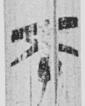不
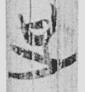足
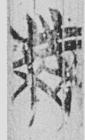無
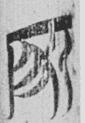所
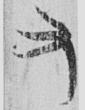又（有）
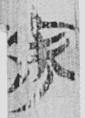○（餘）
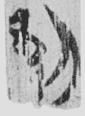割（蓋）
